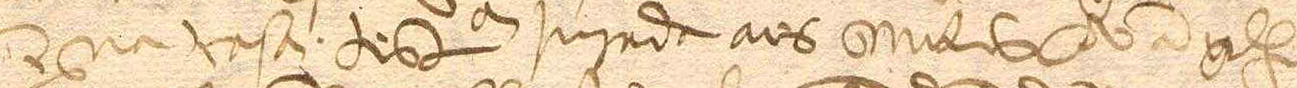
ē sua casa. testa Jurada aos samtos evāgelhos
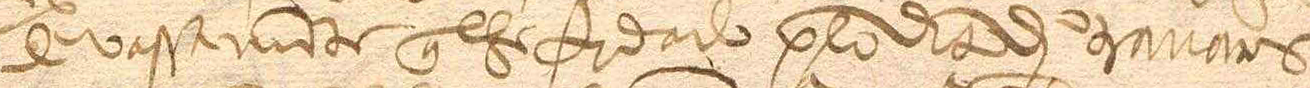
devassamēte q̄ lhe foy dado p̄lo dit̄o djo trauacos
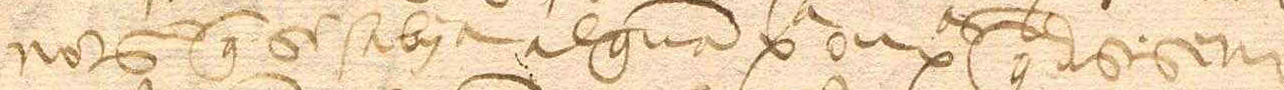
notro q̄ se sabya algūa pa ou pas q̄ disesem
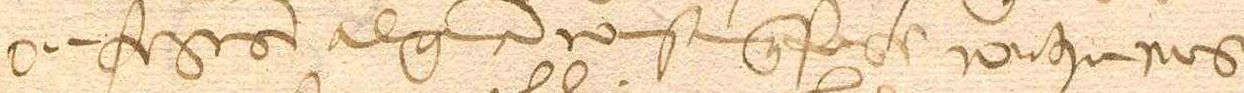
ou fezesē algūa cousa q̄ fose contra nosa
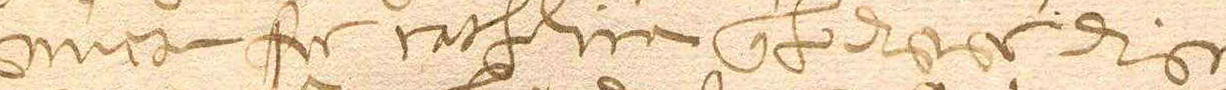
sancta ffee catholica q̄ ho disese dise
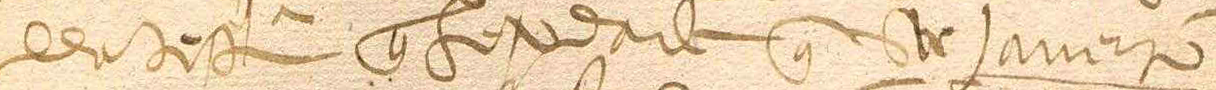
ella testa q̄ he ꝟdade q̄ este Janeiro
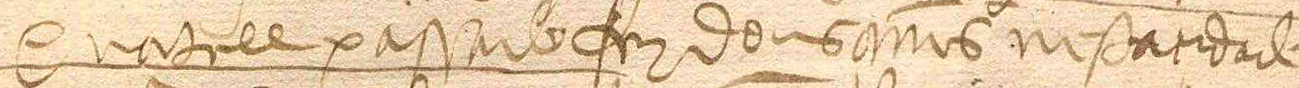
e natall passado fez dous an̄os nesta cidade
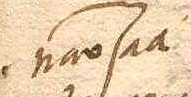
não Jaa
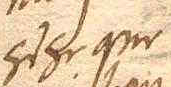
sē se que
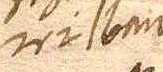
rer bau
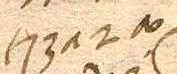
tjzar co
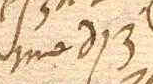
mo djz
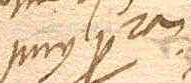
ruy ꝑra
